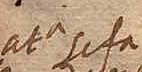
ata se fa
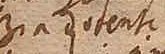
zia dooente
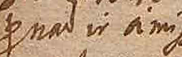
ꝓ nao ir á missa
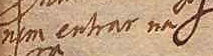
nem entrar na
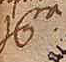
Jgra.
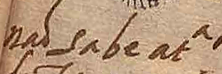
naõ sabe a ta
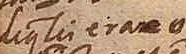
de q̄ lei eram o
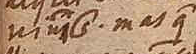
viuiaõ. mas q̄
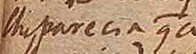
lhe parecia q̄ cō
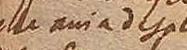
ella auia de sal
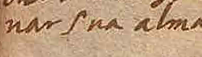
uar sua alma
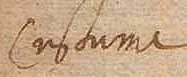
Custume
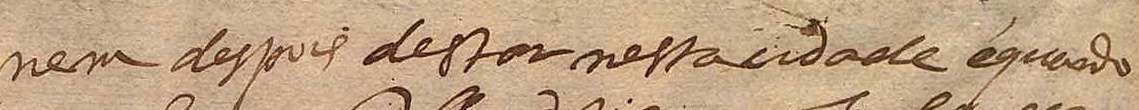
nem despois destar nesta cidade e quando
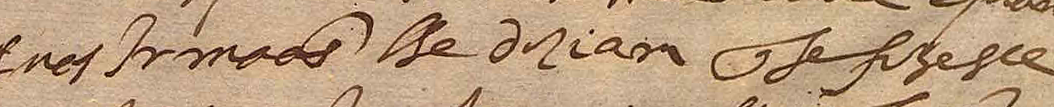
suas Irmaãs lhe diziam q̄ se fizesse
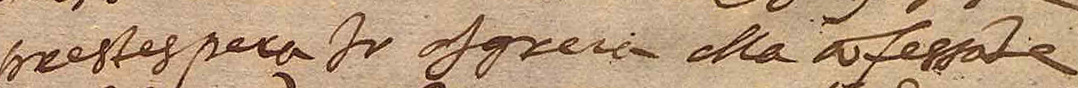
prestes pera Jr a Jgreia ella cōfessāte
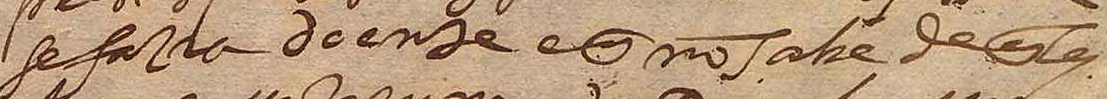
se fazia doente e q̄ nō sabe de q̄ lej
